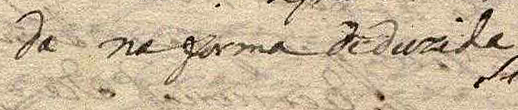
da na forma deduzida
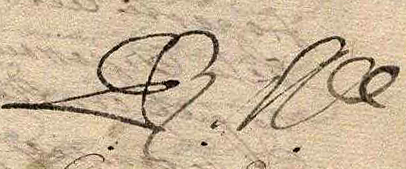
E. R. M.ce
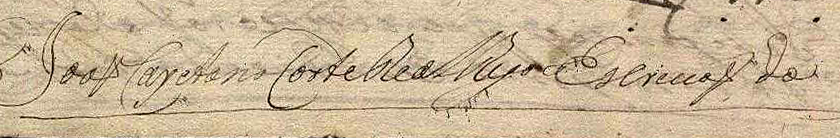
Joaõ Cayetano Corte Real Rego Escriuaõ da
